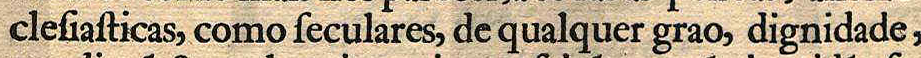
clesiasticas, como seculares, de qualquer grao, dignidade,
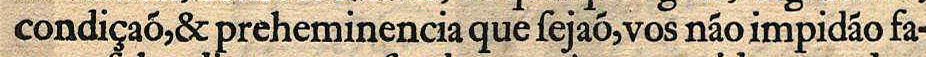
condiçaõ, & preheminencia que sejaõ, vos não impidão fa
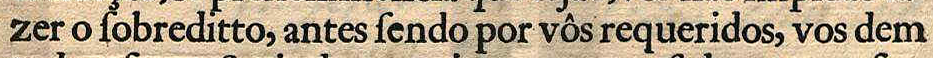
zer o sobreditto, antes sendo por vôs requeridos, vos dem
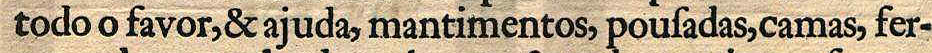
todo o favor, & ajuda, mantimentos, pousadas, camas, fer
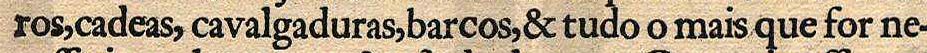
ros, cadeas, cavalgaduras, barcos, & tudo o mais que for ne
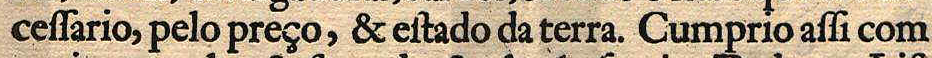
cessario, pelo preço, & estado da terra. Cumprio assi com
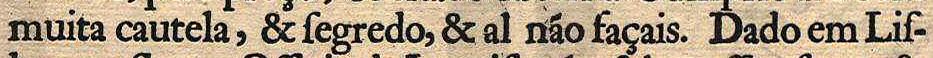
muita cautela, & segredo, & al não façais. Dado em Lis
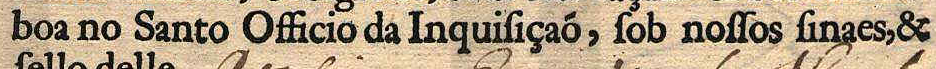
boa no Santo Officio da Inquisiçaõ, sob nossos sinaes, &
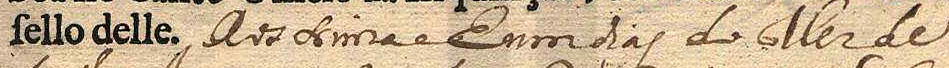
sello delle. Aos trinta e hum dias do Mez de
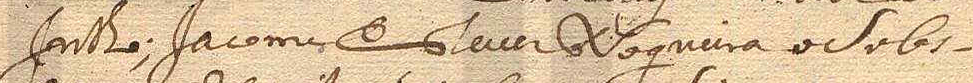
Julho; Jacome Esteues Nogueira o Sobs
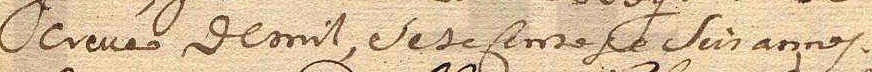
creueo de mil, SeteCentos e Seis annos.
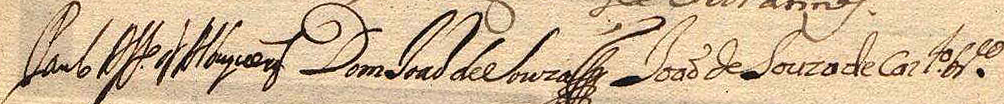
Paulo Aff.o d̄ Albuquerq̄ Dom Ioaõ de Souza Ioaõ de Souza de Cast.o br.co
